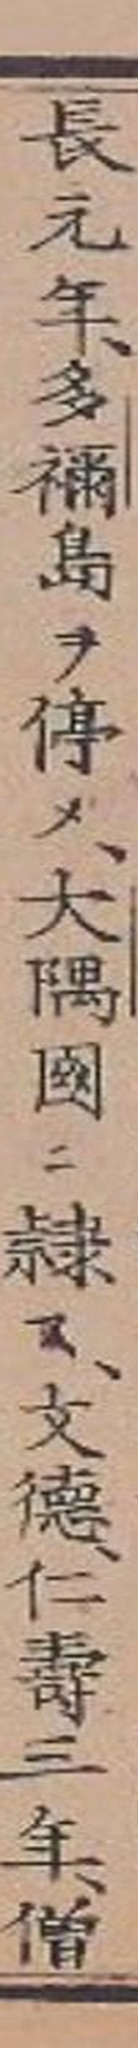長元年、多禰島ヲ停メ、大隅国ニ隷ス、文徳、仁寿三年、僧
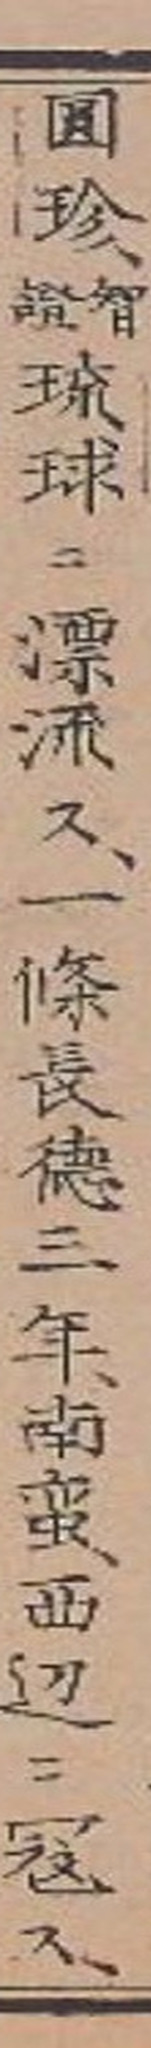円珍、智証琉球ニ漂流ス、一条長徳三年、南蛮、西辺ニ冠ス、
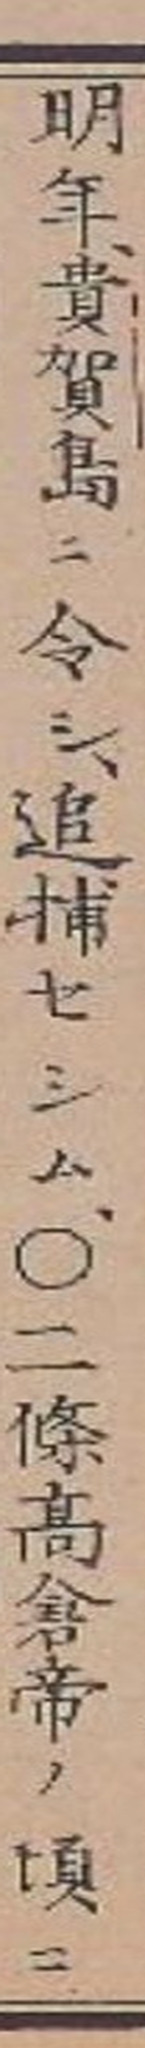明年、貴賀島ニ令シ、追捕セシム、○二条高倉帝ノ頃ニ
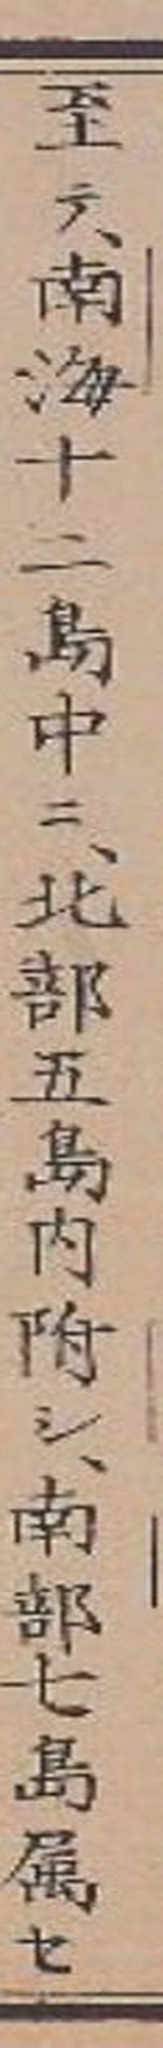至テ、南海十二島中ニ、北部五島内附シ、南部七島属セ
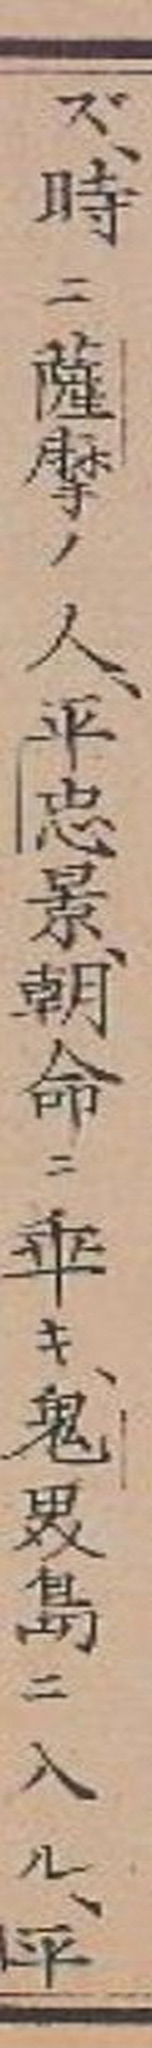ズ、時ニ薩摩ノ人、平忠景、朝命ニ乖キ、鬼界島ニ入ル、平
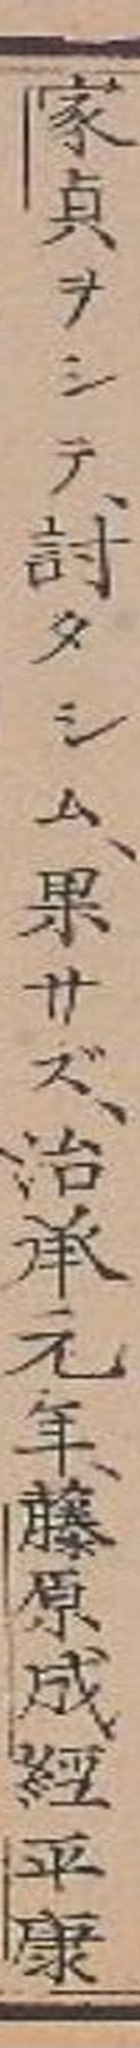家貞ヲシテ、討タシム、果サズ、治承元年、藤原成経平康
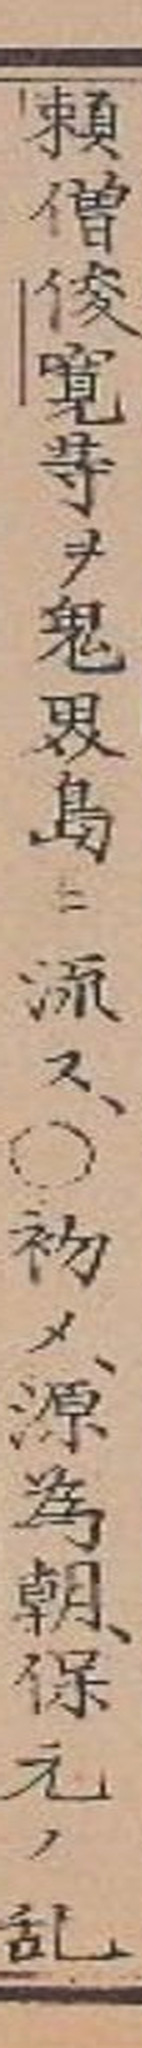頼僧俊寛等ヲ鬼界島ニ流ス、○初メ、源為朝、保元ノ乱
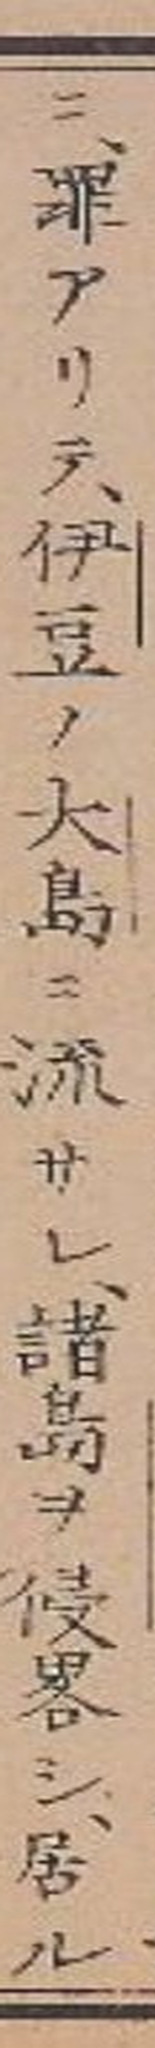ニ、罪アリテ、伊豆ノ大島ニ流サレ、諸島ヲ侵略シ、居ル
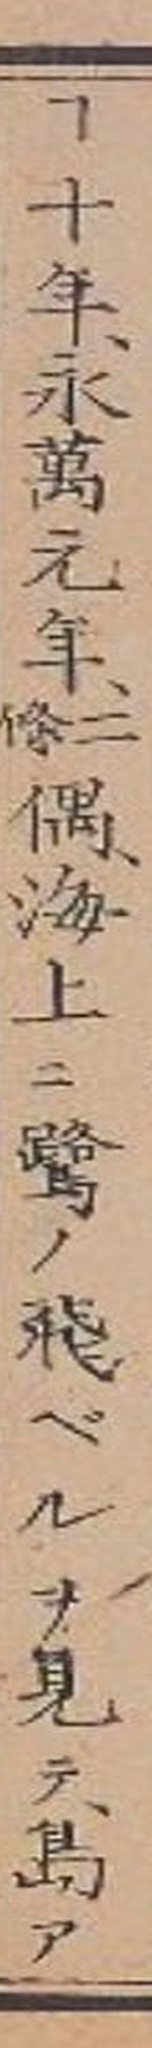ヿ十年、永万元年、二条偶、海上ニ鷺ノ飛ベルヲ見テ、島ア
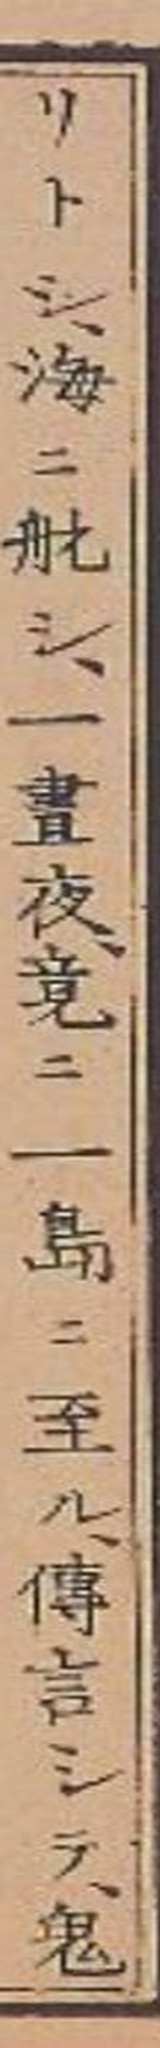リトシ、海ニ航シ、一昼夜、竟ニ一島ニ至ル、伝言シテ、鬼
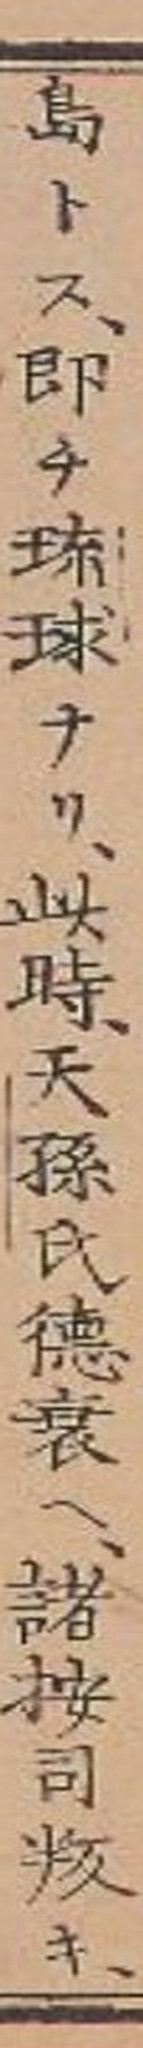島トス、即チ琉球ナリ、此時、天孫氏徳衰ヘ、諸按司叛キ、
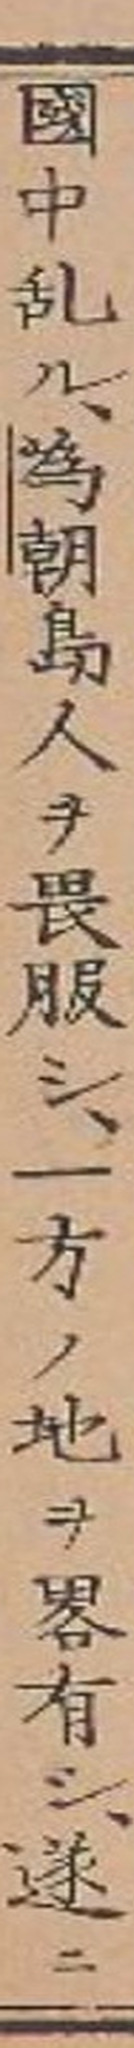国中乱ル、為朝島人ヲ畏服シ、一方ノ地ヲ略有シ、遂ニ
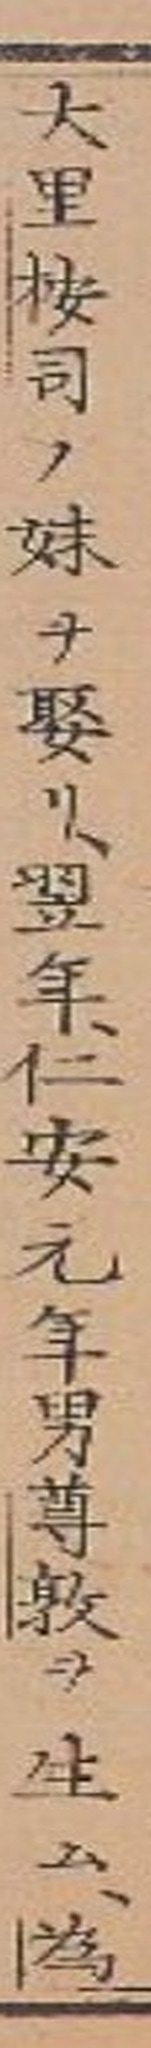大里按司ノ妹ヲ娶リ、翌年、仁安元年男尊敦ヲ生ム、為
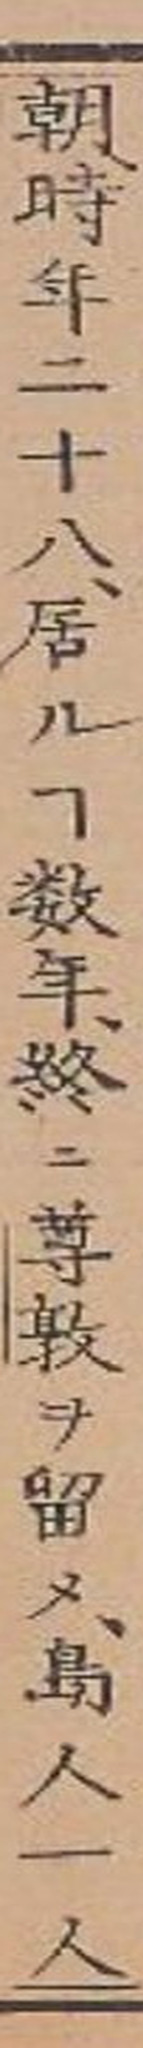朝、時年二十八、居ルヿ数年、終ニ尊敦ヲ留メ、島人一人
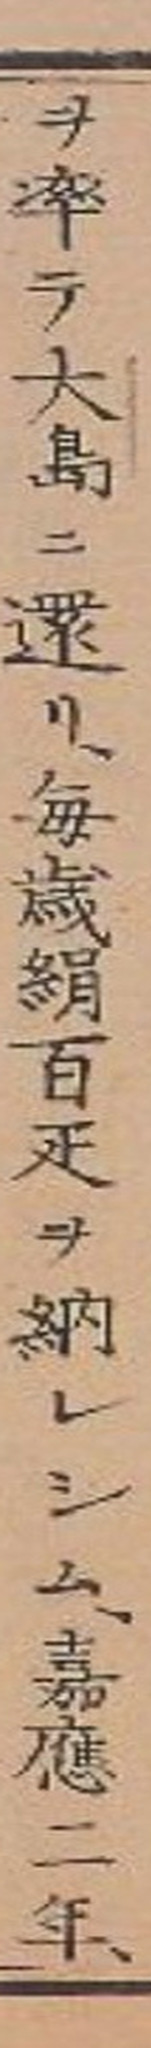ヲ率テ大島ニ還リ、毎歳絹百疋ヲ納レシム、嘉応二年、
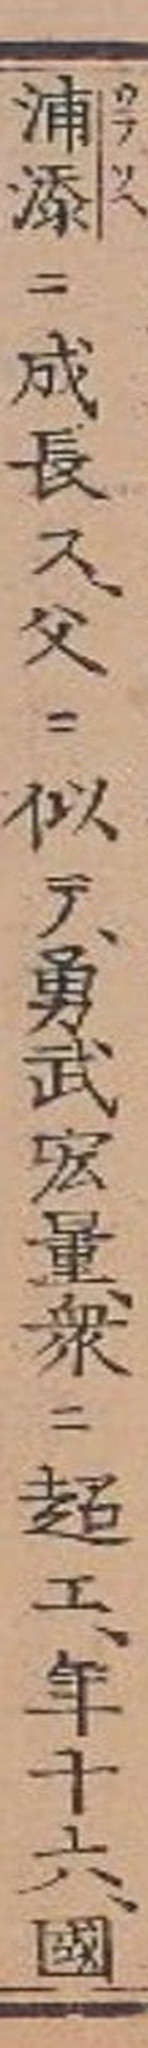浦添ニ成長ス、父ニ似テ、勇武宏量、衆ニ超エ、年十六、国
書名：琉球新誌 巻上
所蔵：University of the Ryukyus Library
